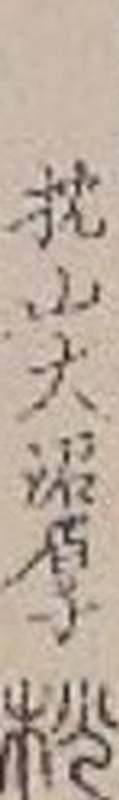枕山大沼厚

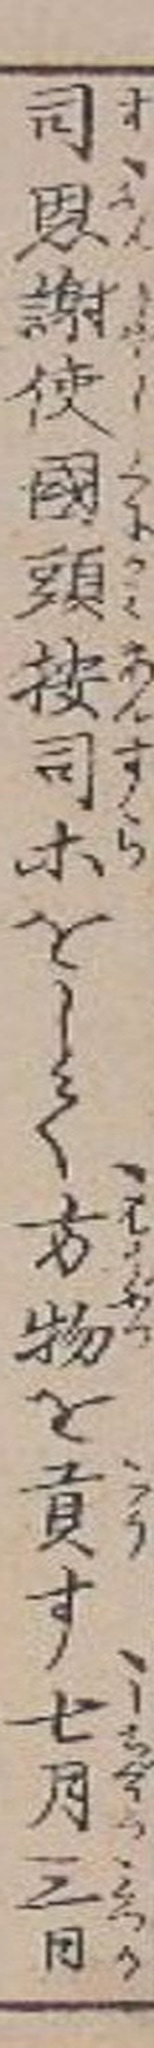司、恩謝使国頭按司等をして、方物を貢す、七月三日
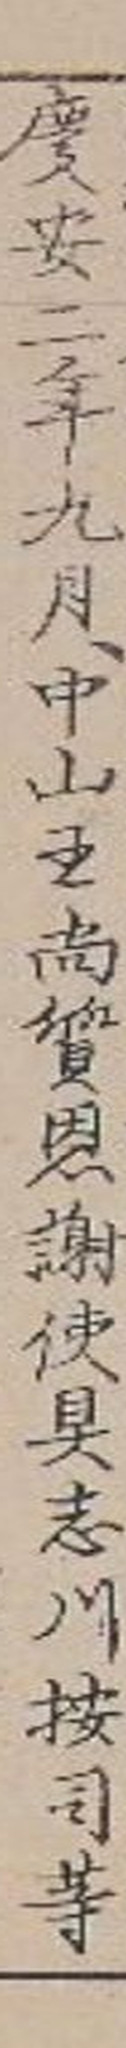慶安二年九月、中山王尚質、恩謝使具志川按司等
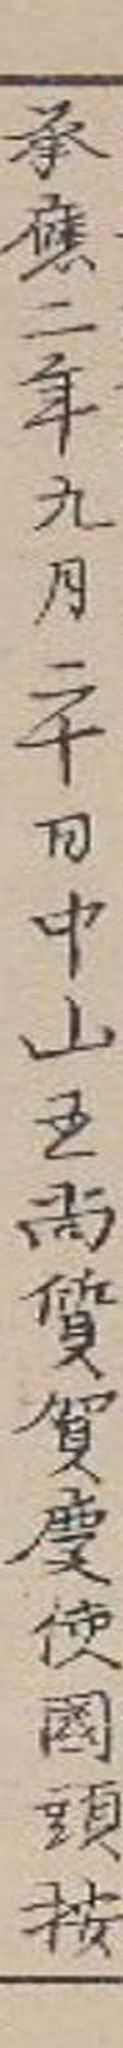承応二年九月二十日、中山王尚質、賀慶使国頭按
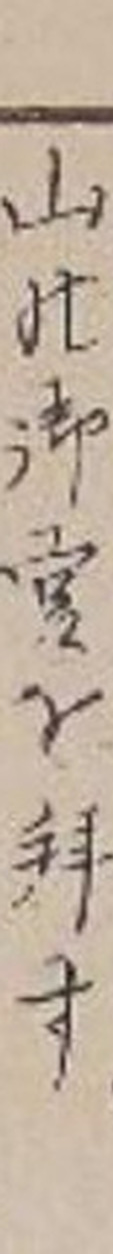山の御宮を拝す、
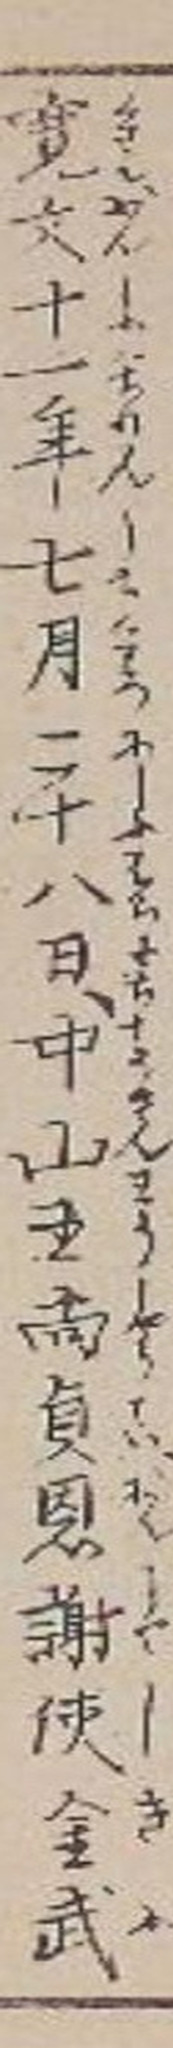寛文十一年七月二十八日、中山王尚貞、恩謝使金武
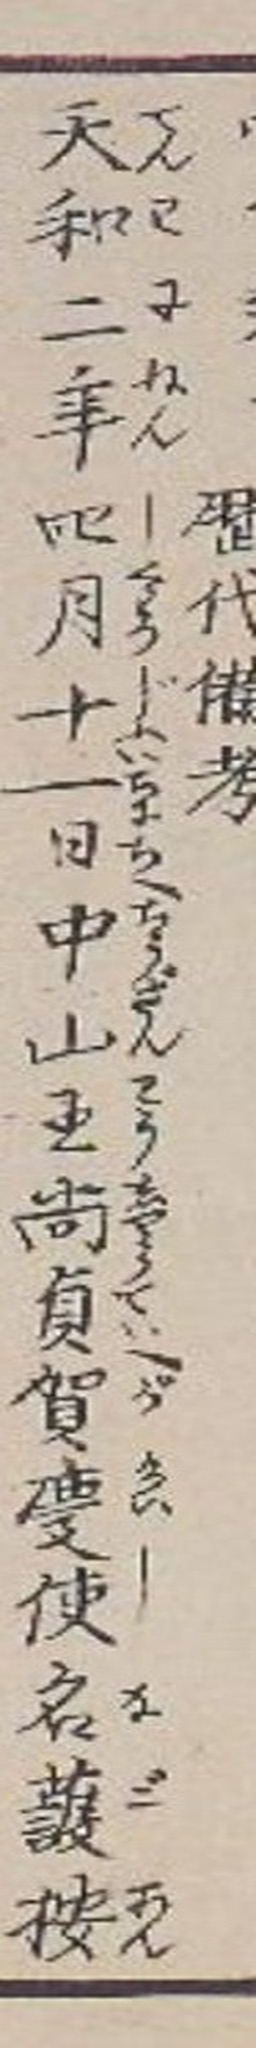天和二年四月十一日、中山王尚貞、賀慶使名護按
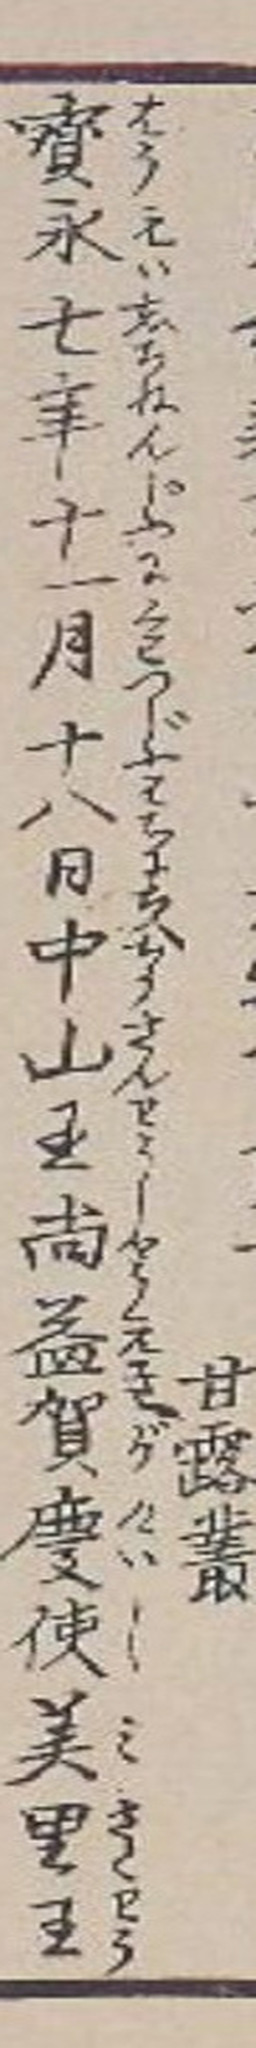宝永七年十一月十八日、中山王尚益、賀慶使美里王
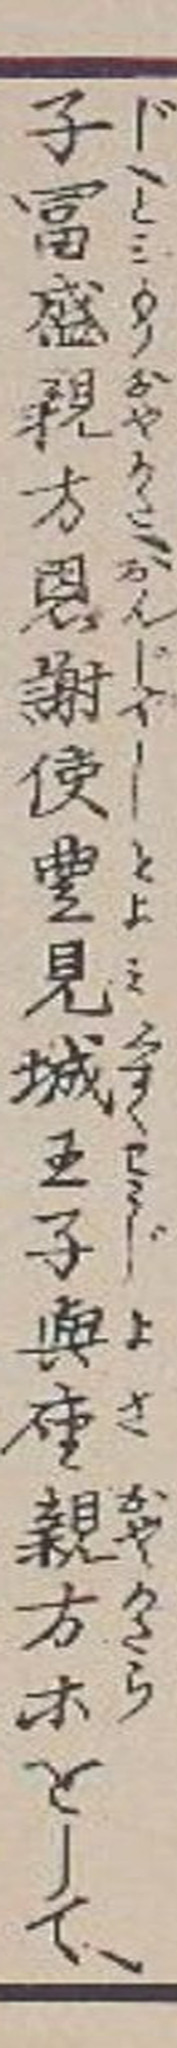子、富盛親方、恩謝使豊見城王子与座親方等をして、
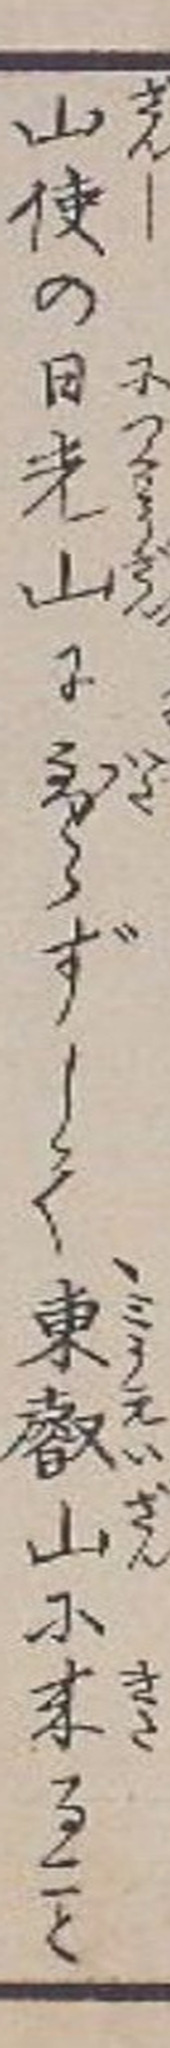山使の日光山に至らずして、東叡山に来ること
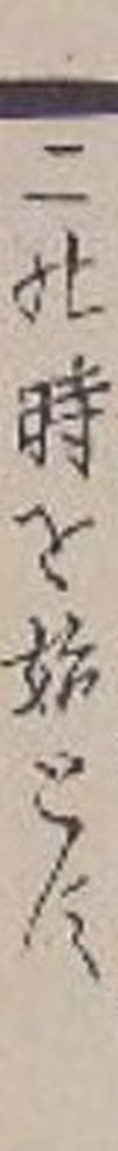この時を始とす、

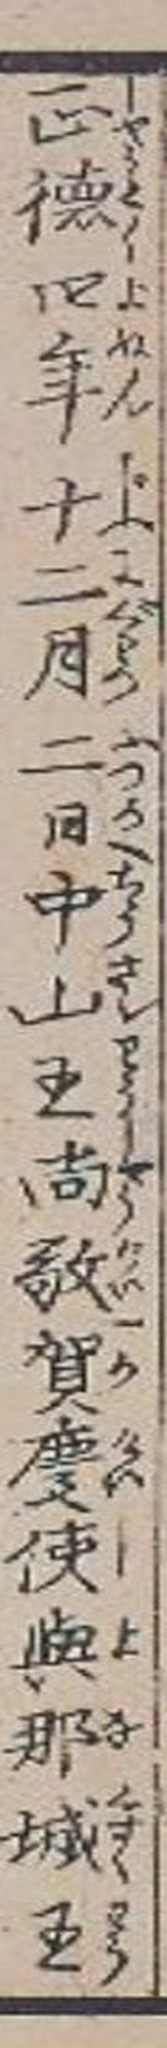正徳四年十二月二日、中山王尚敬、賀慶使与那城王
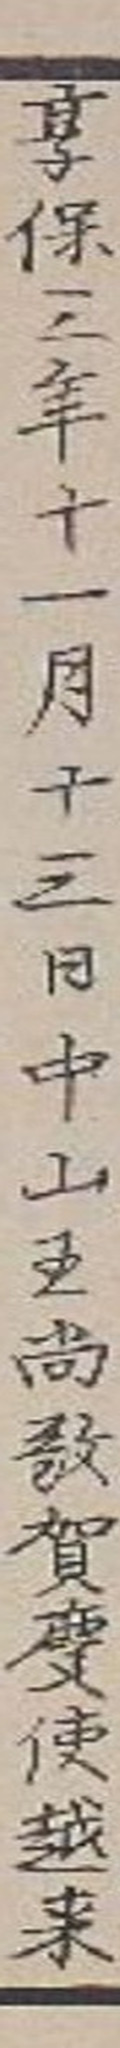享保三年十一月十三日、中山王尚敬、賀慶使越来
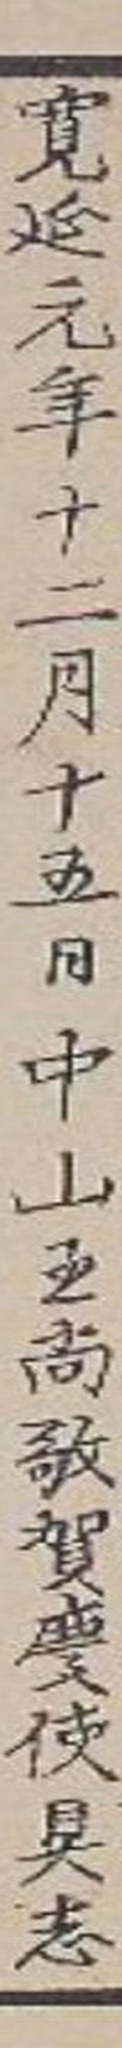寛延元年十二月十五日、中山王尚敬、賀慶使具志
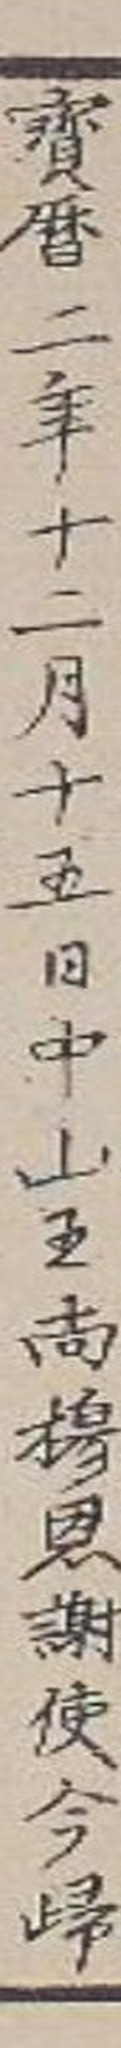宝暦二年十二月十五日、中山王尚穆、恩謝使今帰
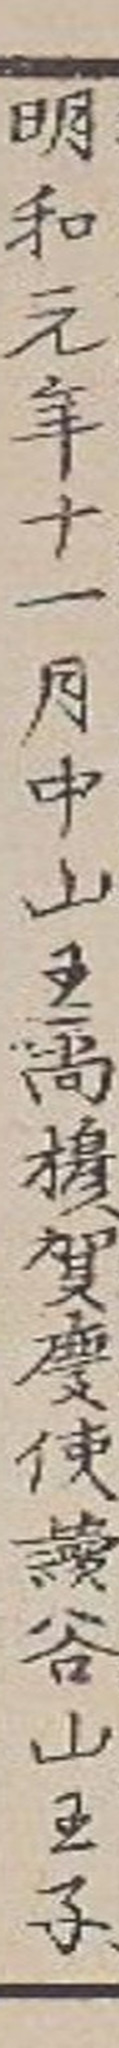明和元年十一月、中山王尚穆、賀慶使読谷山王子、
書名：琉球入貢紀略
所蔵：University of the Ryukyus Library
